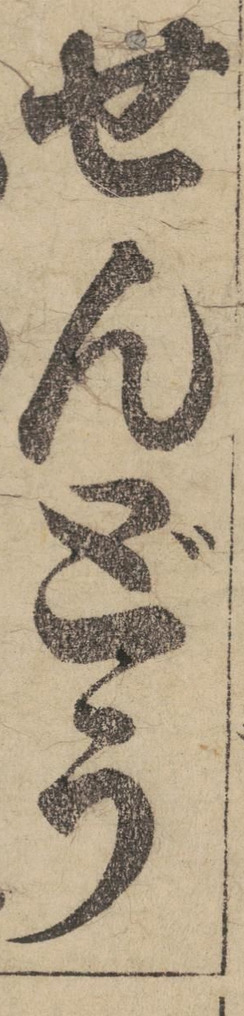せんどう
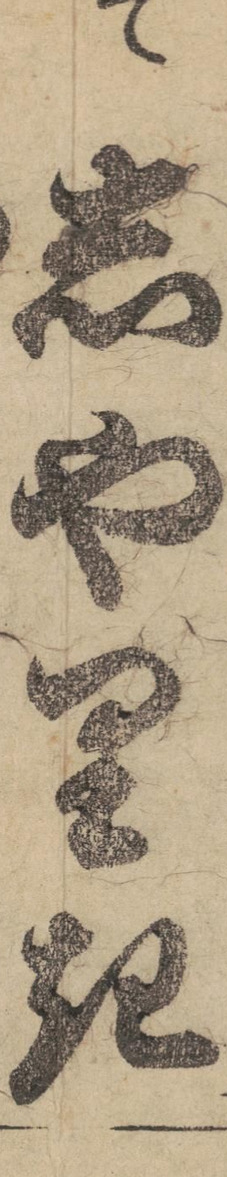しやりき
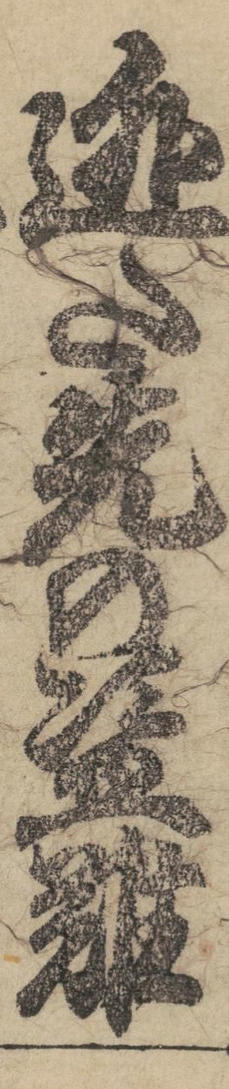逃た先の盗難
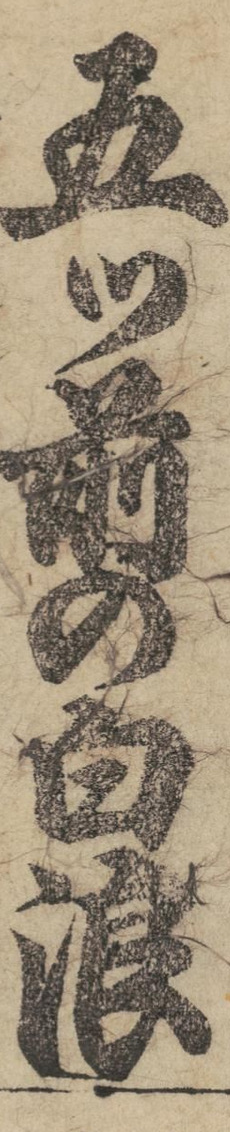五ツ前の白浪
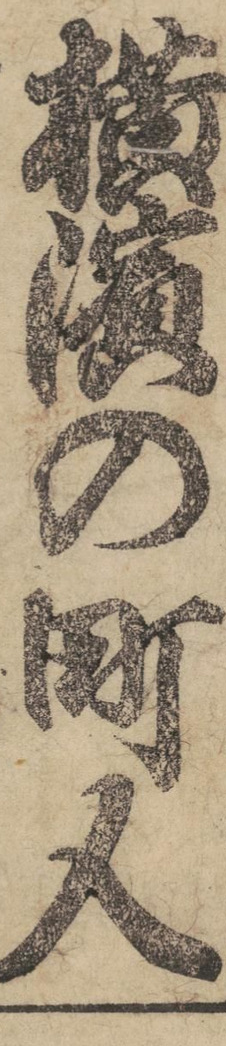横浜の町人
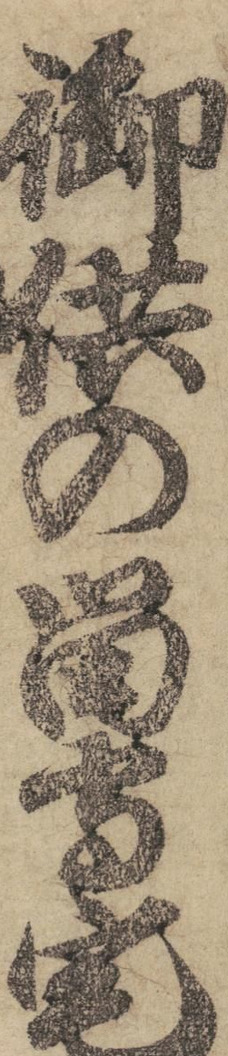御供の留守宅
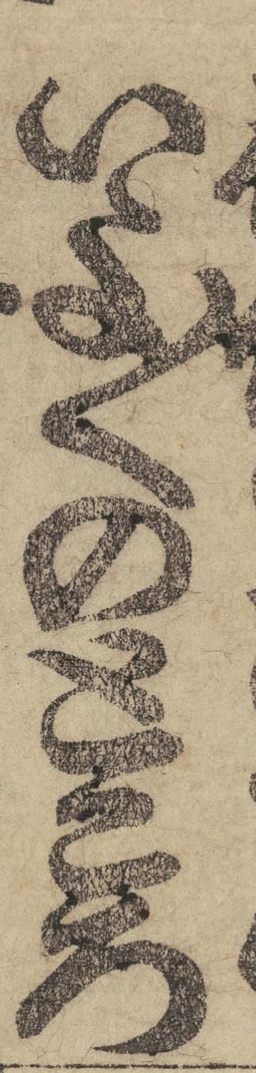いよ〳〵のところ
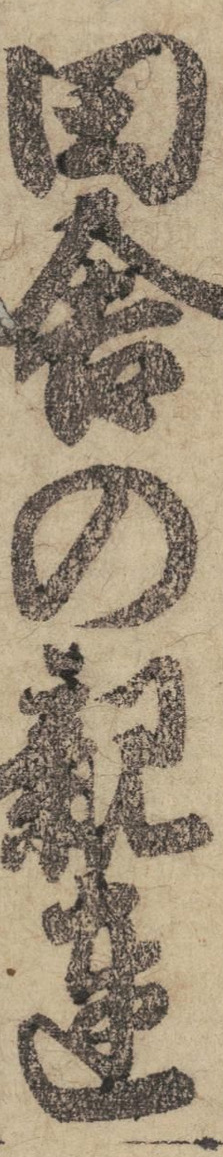田舎の親達
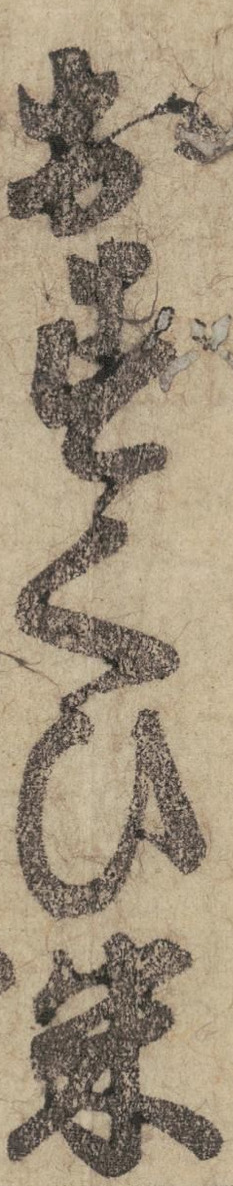おすくひ米
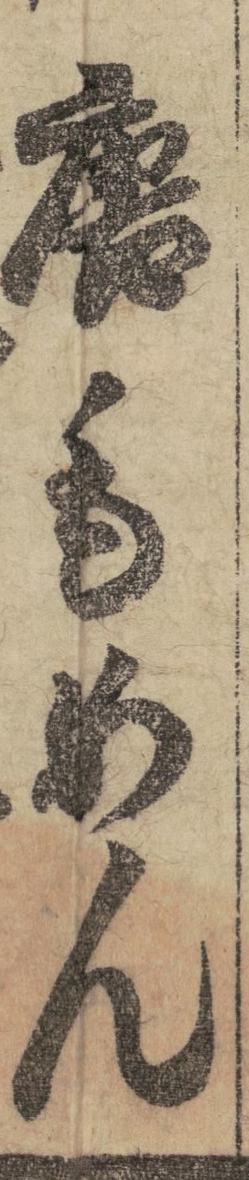唐もめん
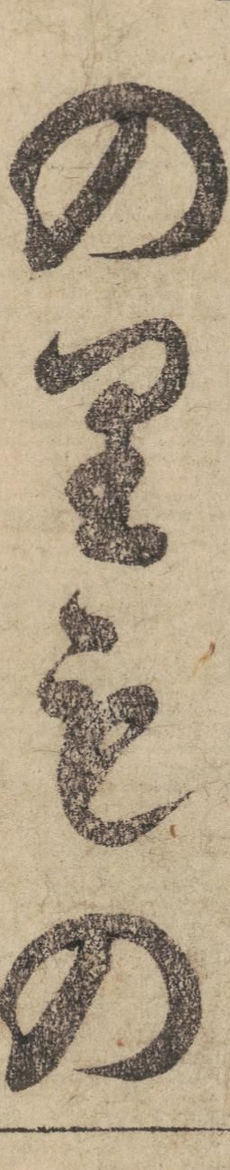のりもの
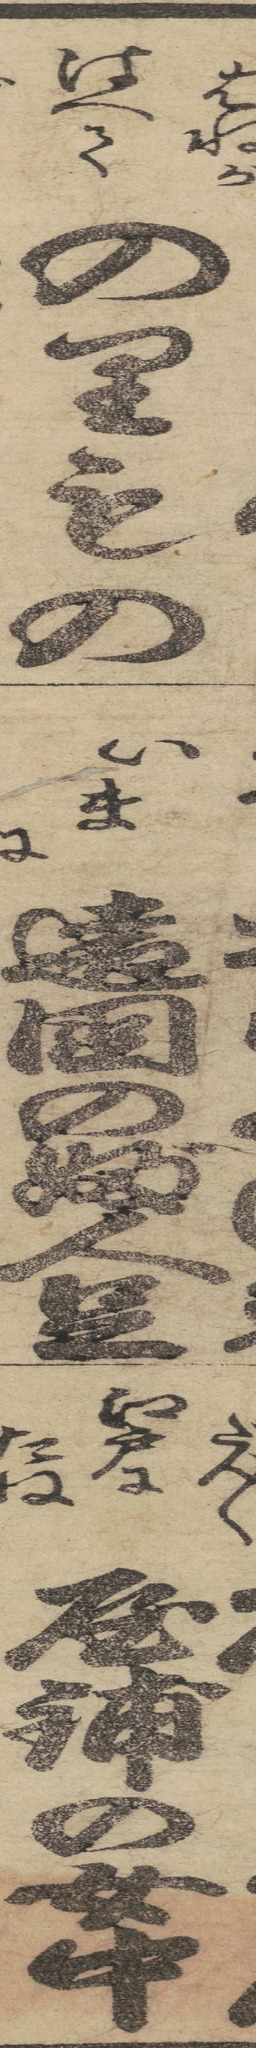のりもの
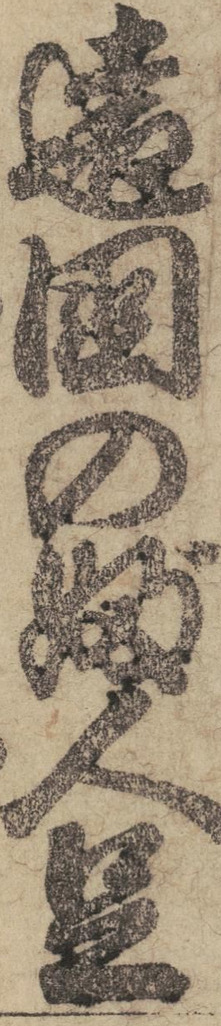遠国の婦人足
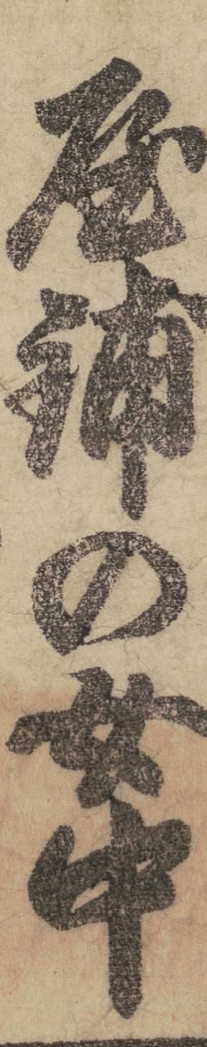屋舗の女中
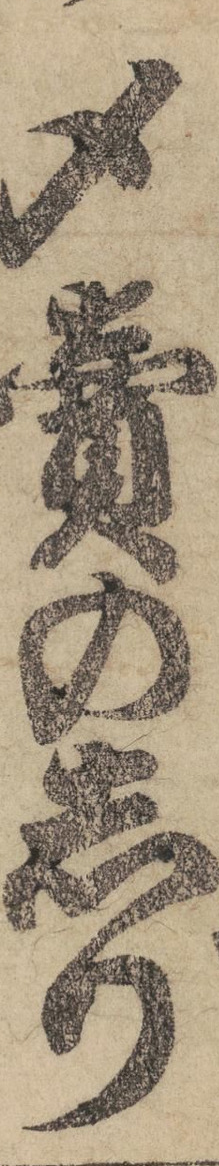〆売のしり
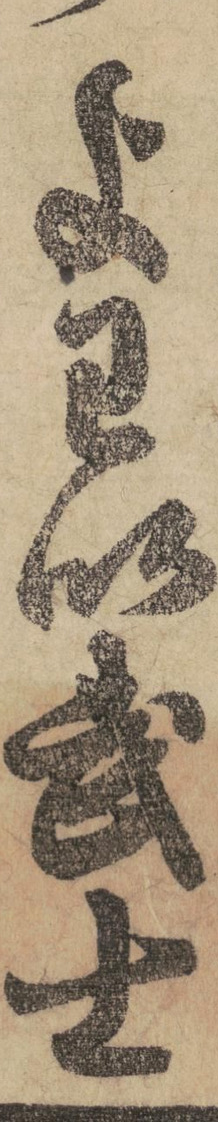よわい武士
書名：當時見立町盡三幅對初編
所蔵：東京大学地震研究所図書室 Earthquake Research Institute Library, The University of Tokyo, JAPAN
